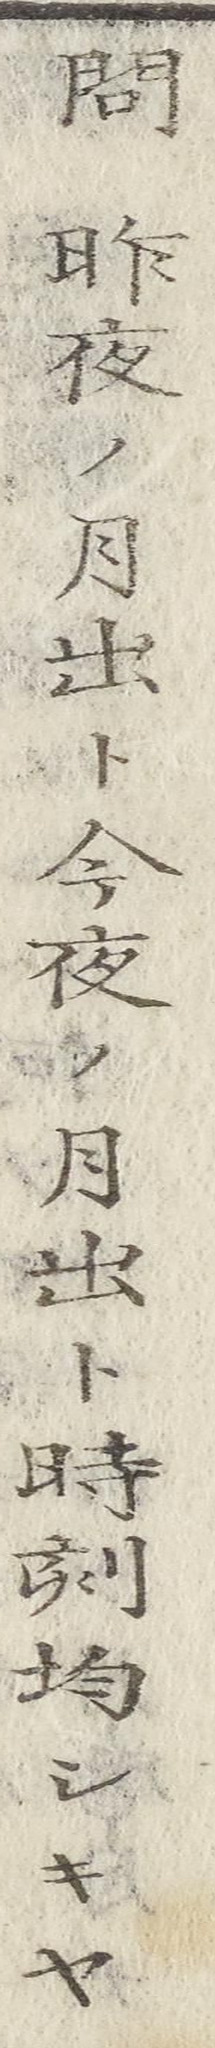問昨夜ノ月出ト今夜ノ月出ト時刻均シキヤ
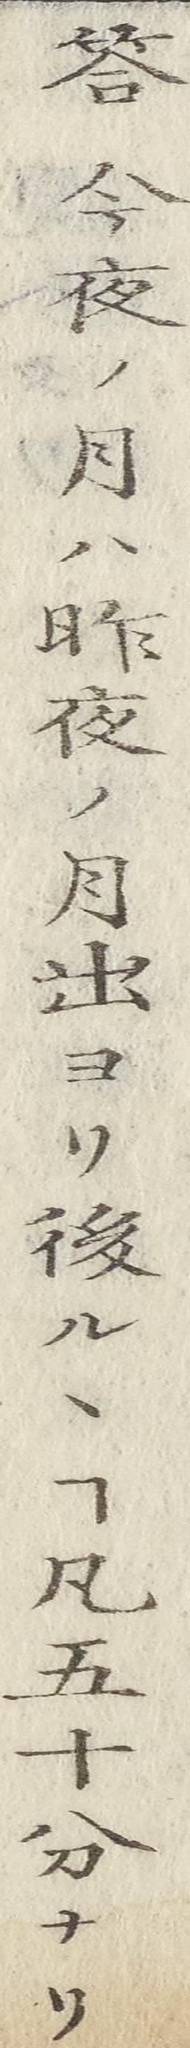答今夜ノ月ハ昨夜ノ月出ヨリ後ルヽコト凡五十分ナリ
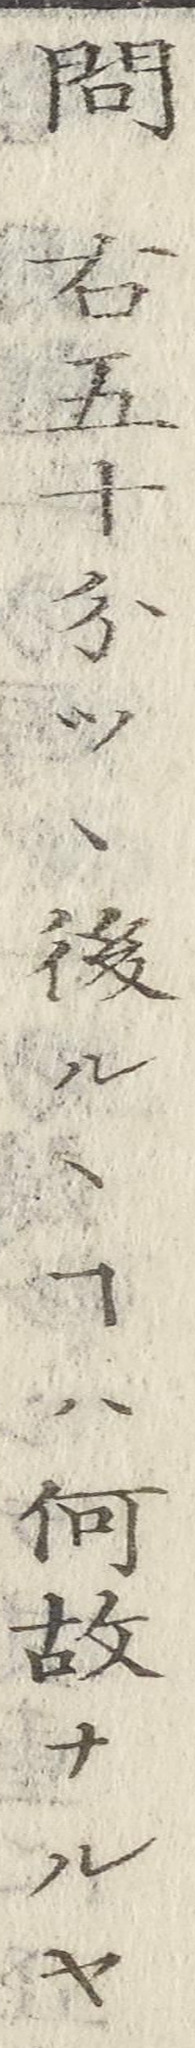問右五十分ツヽ後ルヽコトハ何故ナルヤ
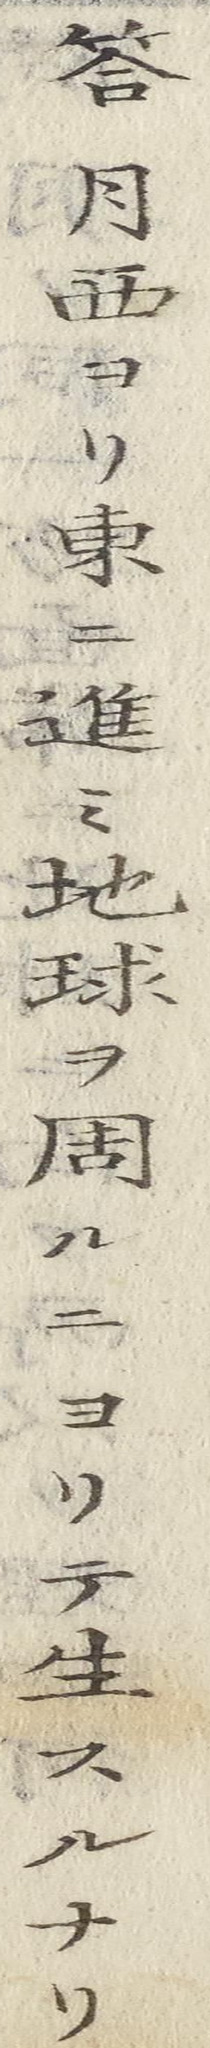答月西ヨリ東ニ進ミ地球ヲ周ルニヨリテ生スルナリ
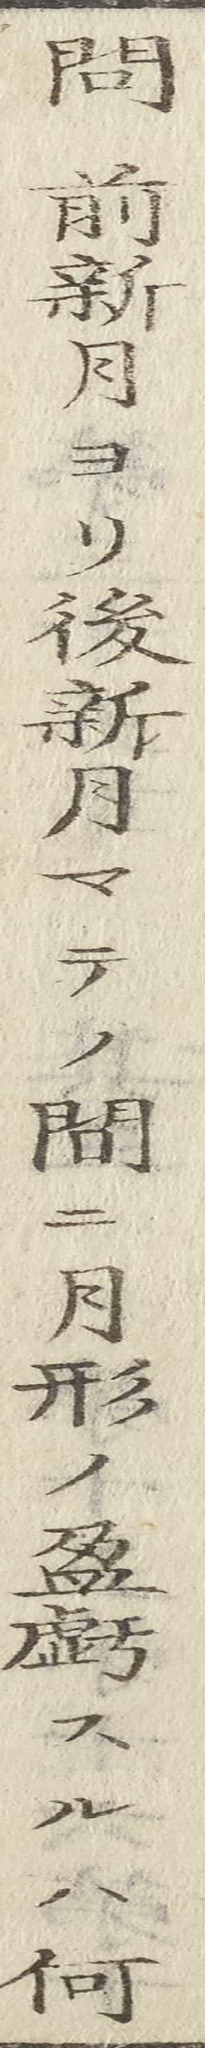問前新月ヨリ後新月マテノ間ニ月形ノ盈虧スルハ何
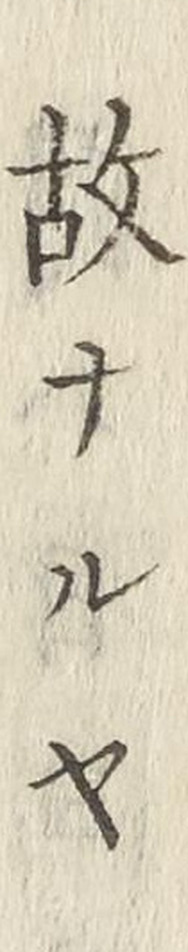故ナルヤ
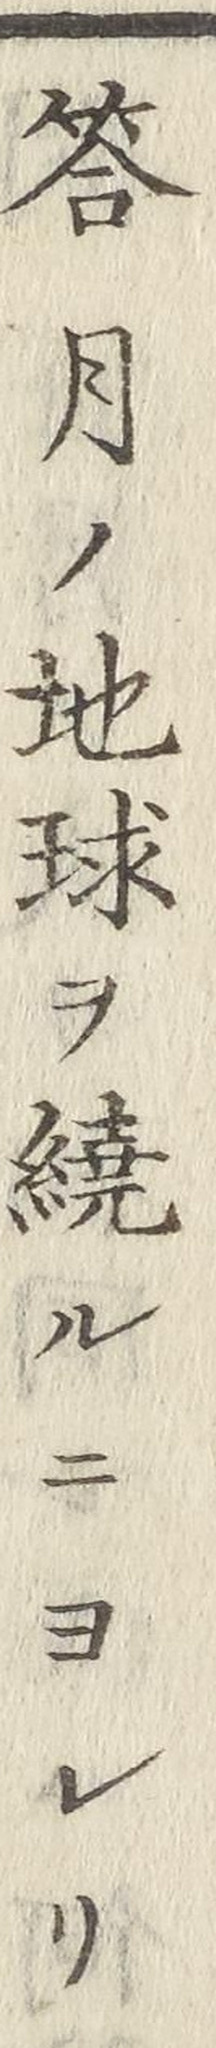答月ノ地球ヲ繞ルニヨレリ
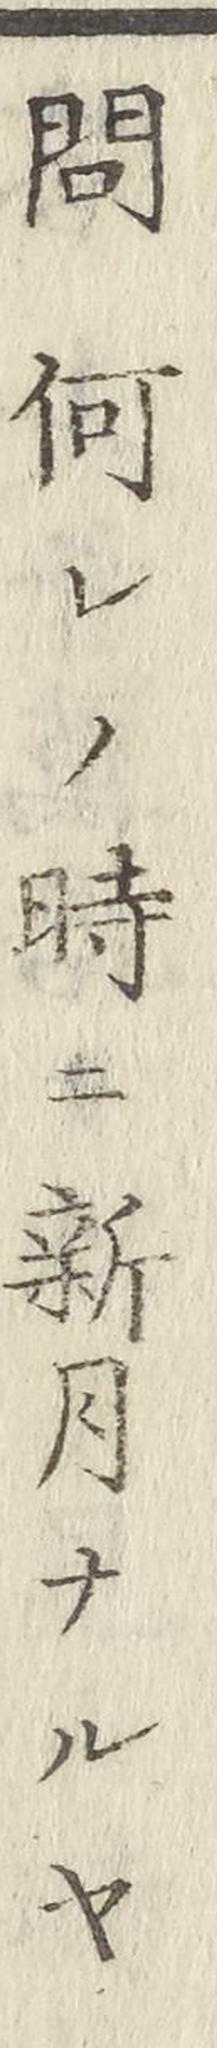問何レノ時ニ新月ナルヤ
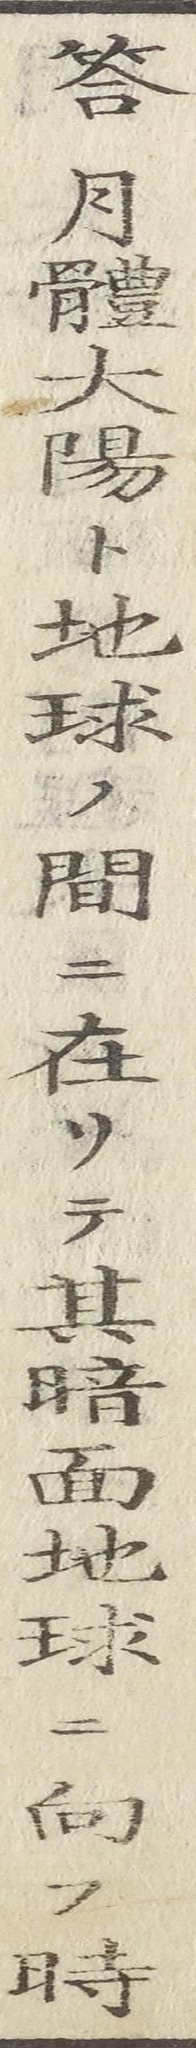答月体大陽ト地球ノ間ニ在リテ其暗面地球ニ向フ時
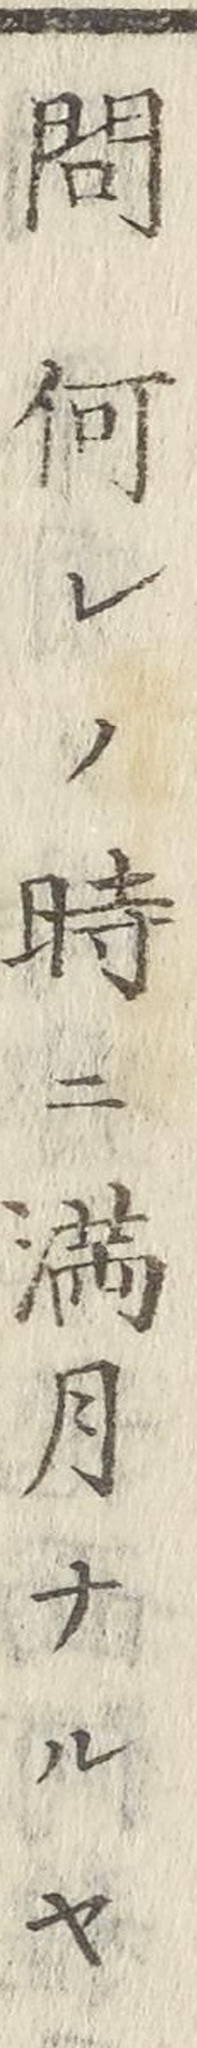問何レノ時ニ満月ナルヤ
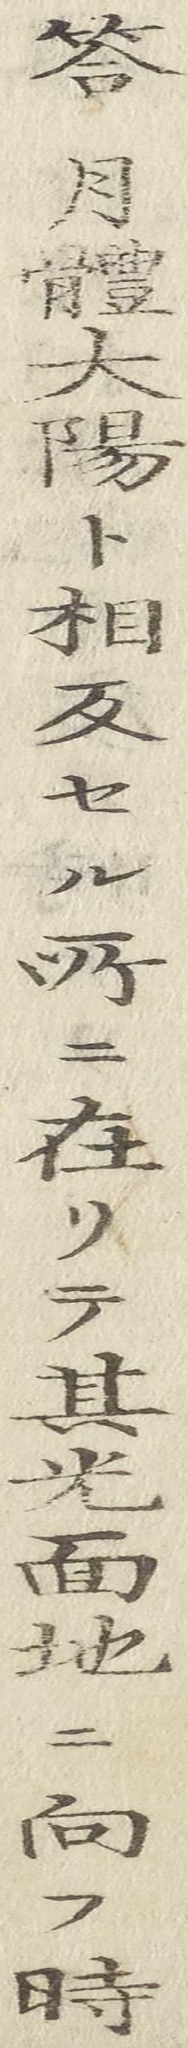答月体大陽ト相反セル所ニ在リテ其光面地ニ向フ時
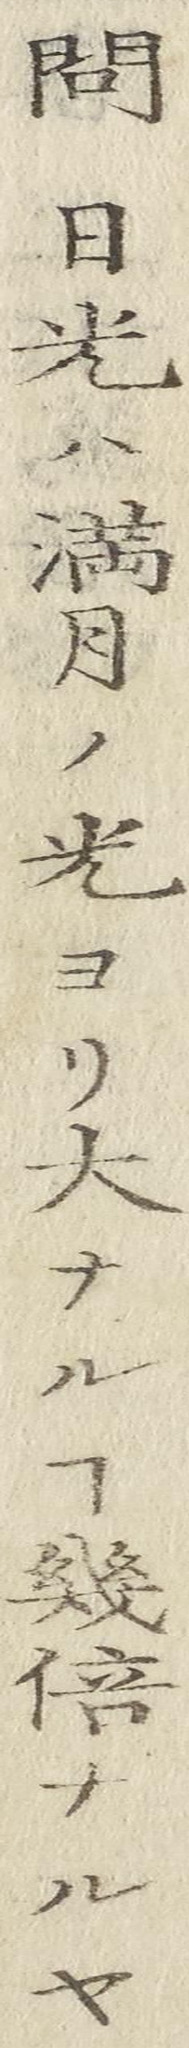問日光ハ満月ノ光ヨリ大ナルコト幾倍ナルヤ

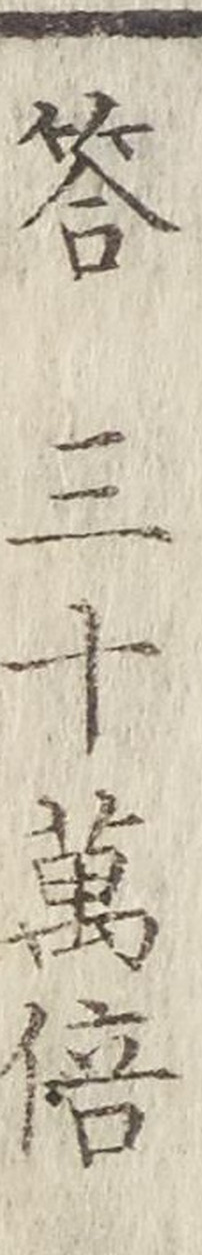答三十万倍
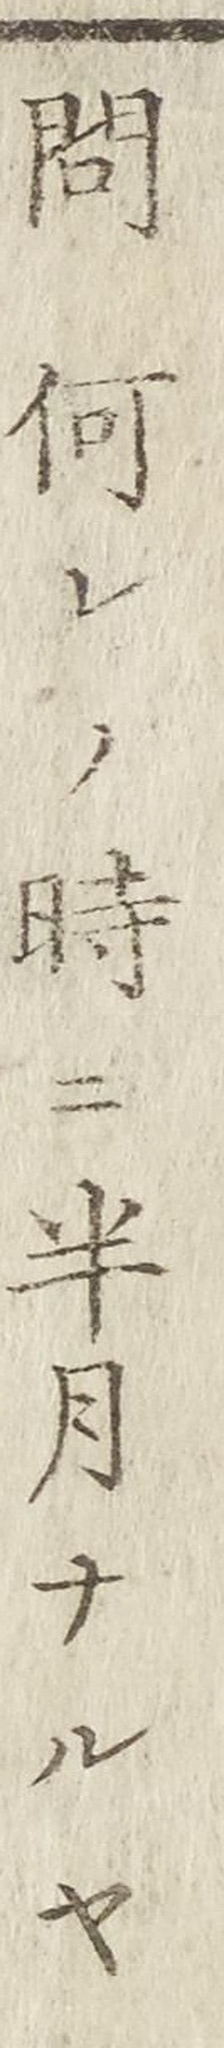問何レノ時ニ半月ナルヤ
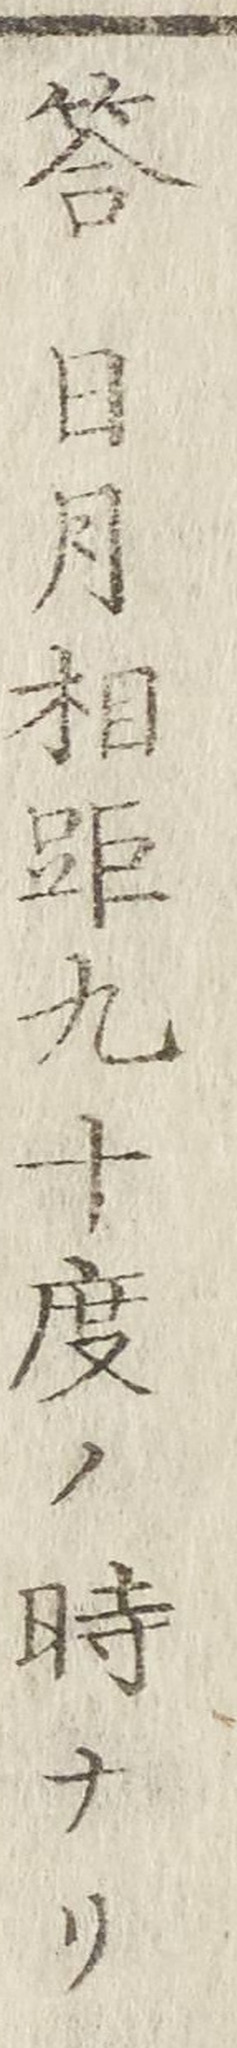答日月相距九十度ノ時ナリ
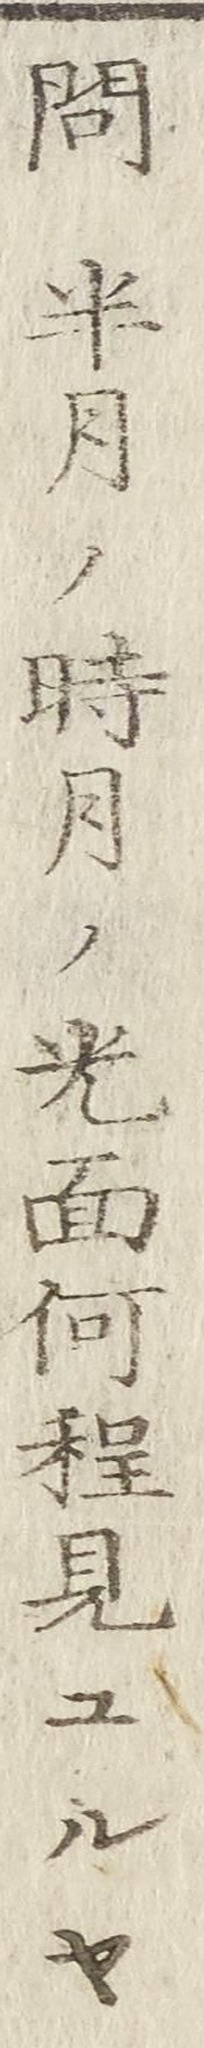問半月ノ時月ノ光面何程見ユルヤ
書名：星学圖説　下
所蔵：東京大学地震研究所図書室 Earthquake Research Institute Library, The University of Tokyo, JAPAN
